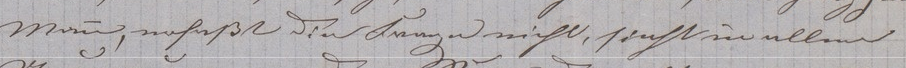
Mann, erfaßt die Frage nicht, sieht in allen
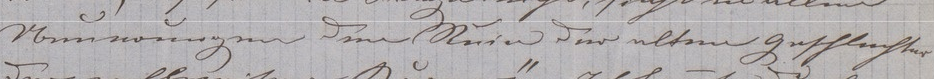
Neuerungen den Ruin der alten Geschlechter
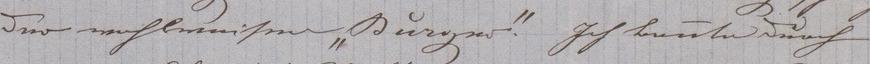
der wohlweiser «Bürger». Ich konnte durch
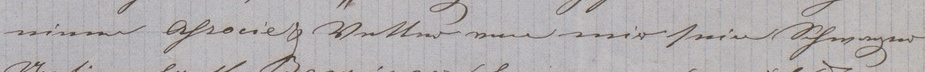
einen Associe & Vetter von mir sein Schwager
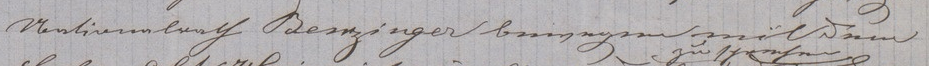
Nationalrath Benzinger bewegen mit dem
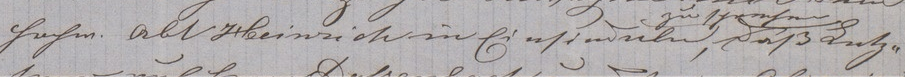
hochw. Abt Heinrich in Einsiedelnzu sprechen, daß Letz-
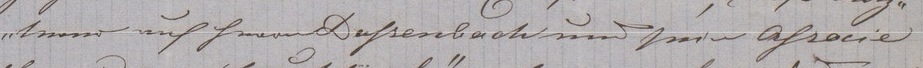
terer auf Herrn Dossenbach und sein Associe
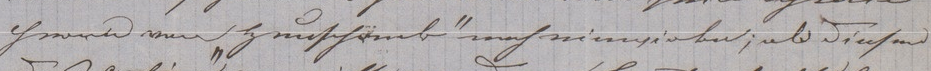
Herrn von «Heuschänk» noch einwirke; ob diesem
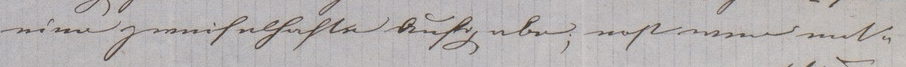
eine zweifelhafte Aufgabe; erst wenn ent-
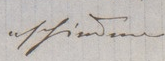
schieden
